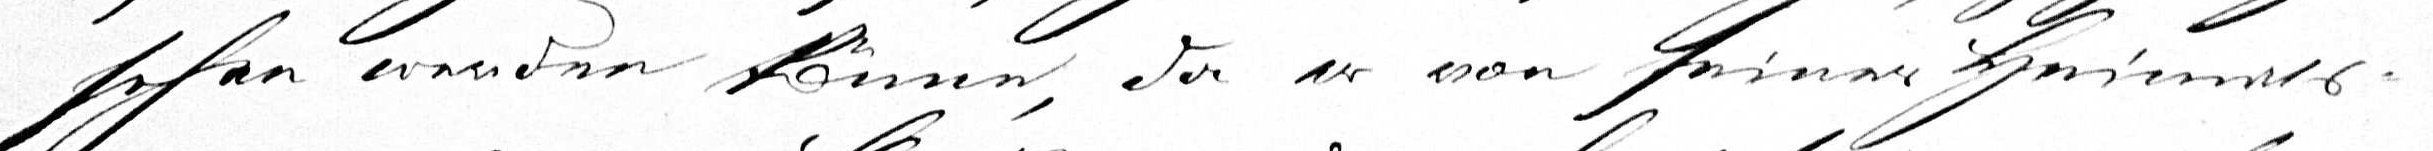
sehen werden könne, da er von seiner Heimats¬
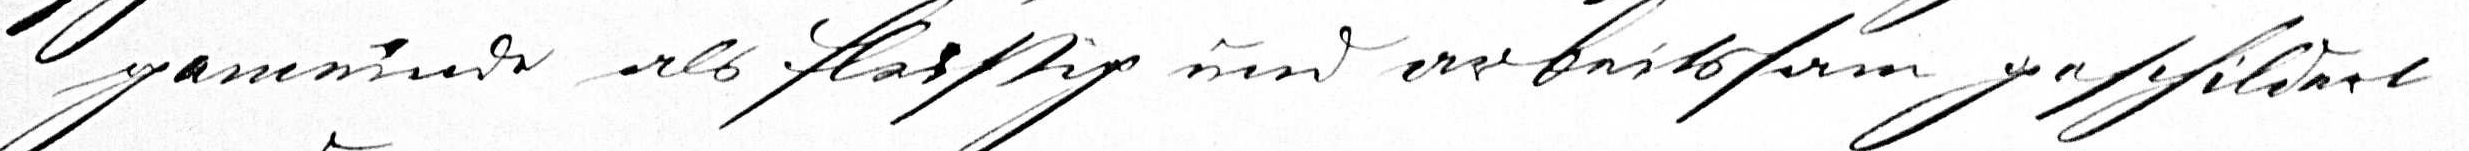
gemeinde als fleißig und arbeitsam geschildert
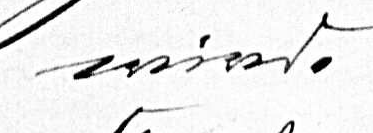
wird.
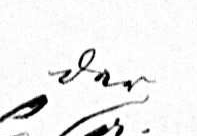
der
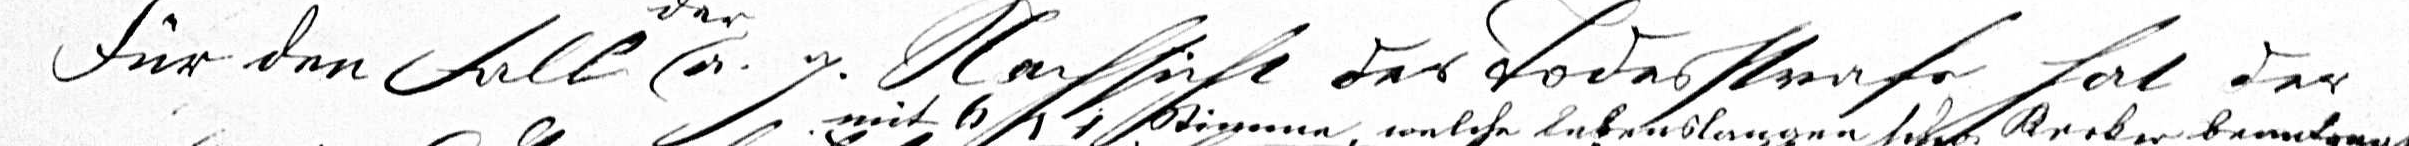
Für den Fall a.g. Nachsicht der Todesstrafe hat der
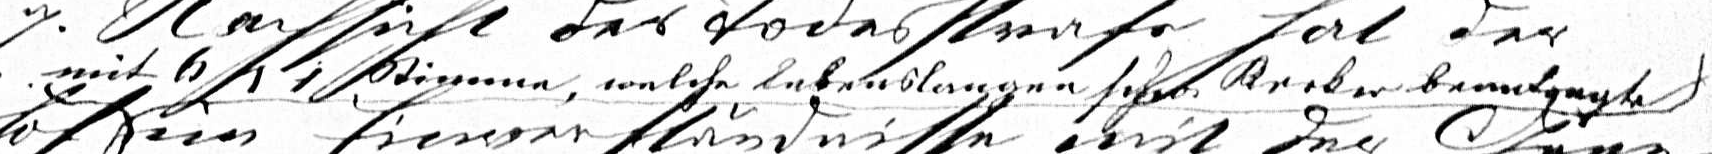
mit 6>1 Stimme, welche lebenslangen schw. Kerker beantragte,
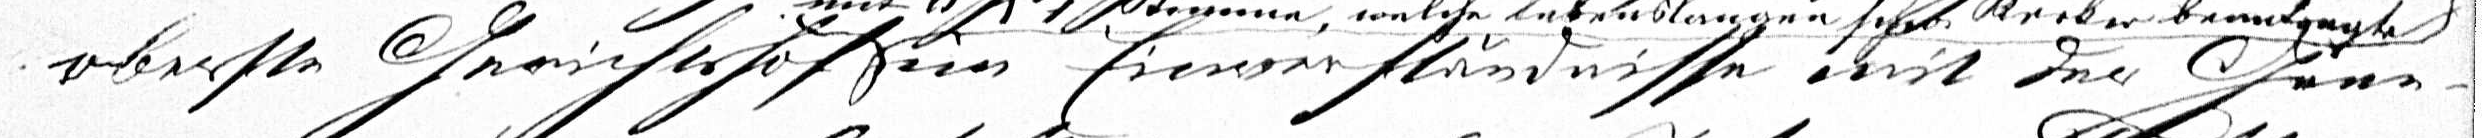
oberste Gerichtshof im Einverständnisse mit der Gene¬
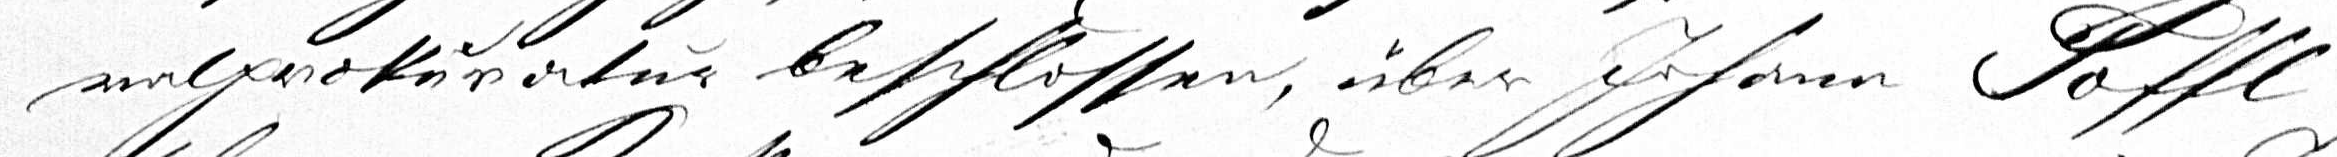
ralprokuratur beschlossen, über Johann Toffl
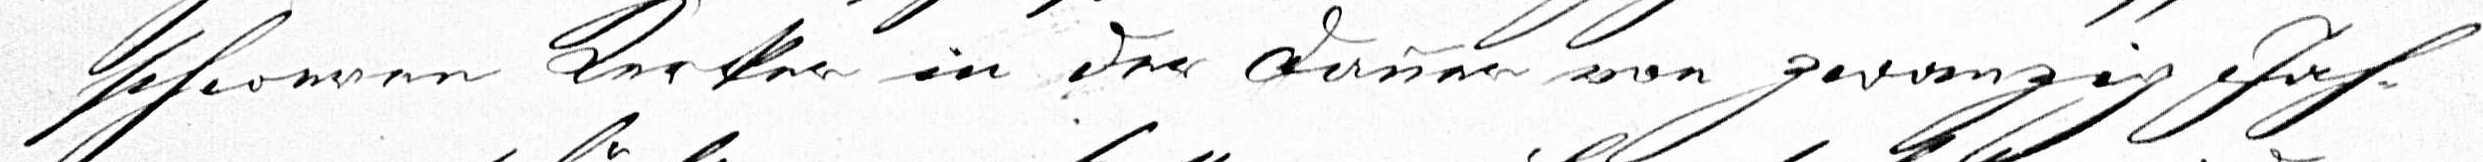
schweren Kerker in der Dauer von zwanzig Jah¬
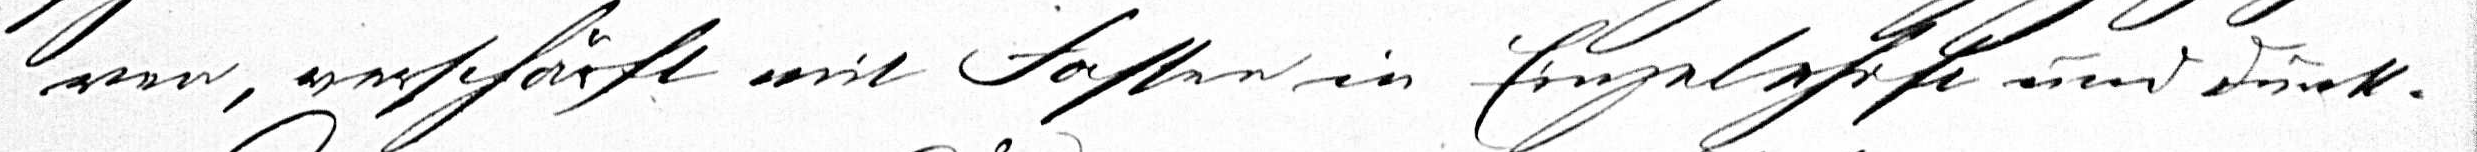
ren verschärft mit Fasten in Einzelhaft und dunk¬
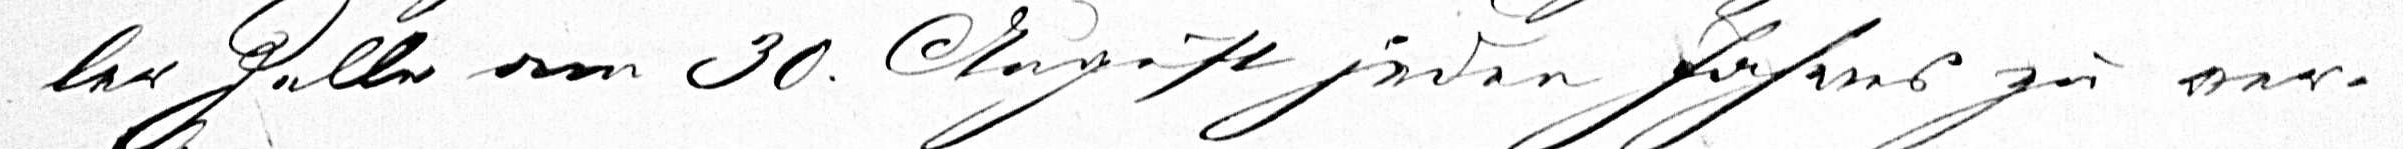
ler Zelle am 30. August jeden Jarhes zu ver¬
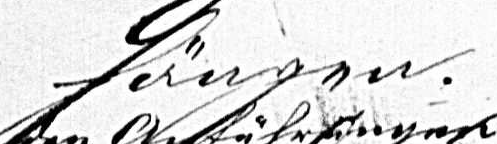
hängen.
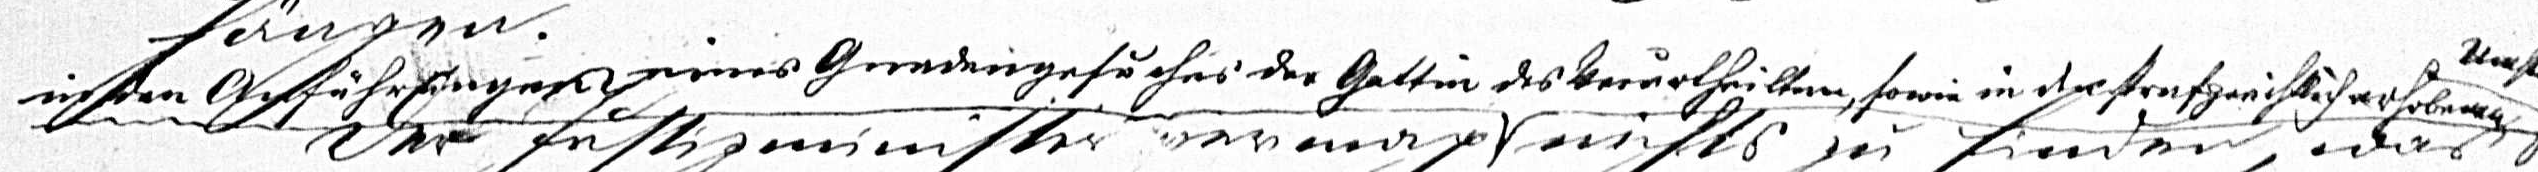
in den Anführungen eines Gnadensgesuches der Gattin des Verurtheilten, sowie in der strafgerichtlich erhobenen
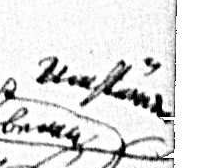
Umständen
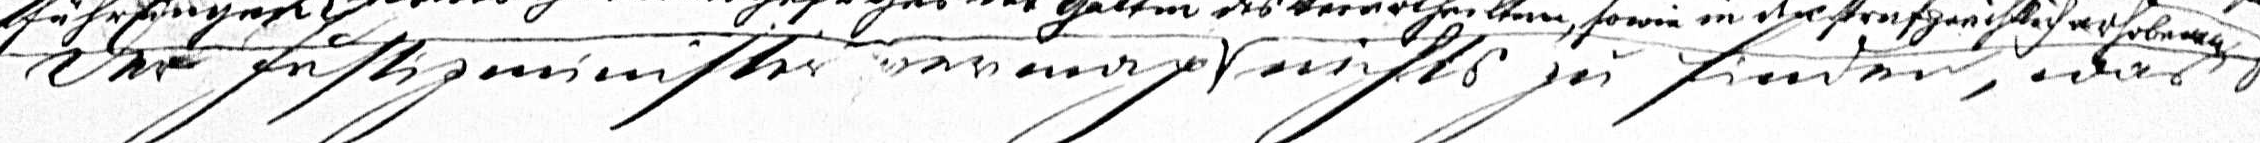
Der Justizminister vermag, nichts zu finden, was
